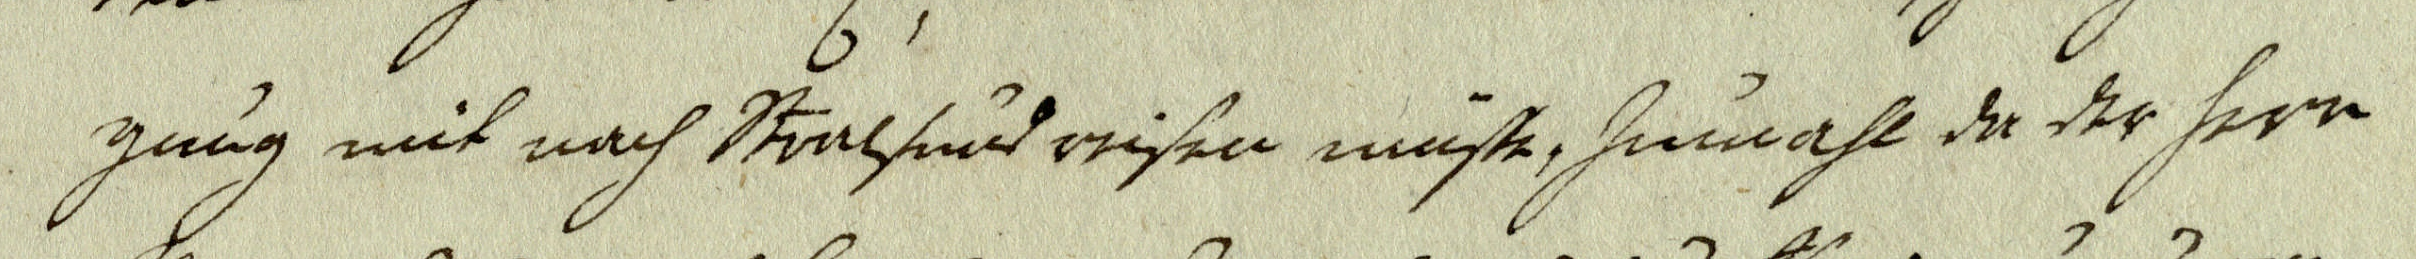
gung mit nach Stralsund reisen müsse, zumahl da der Herr
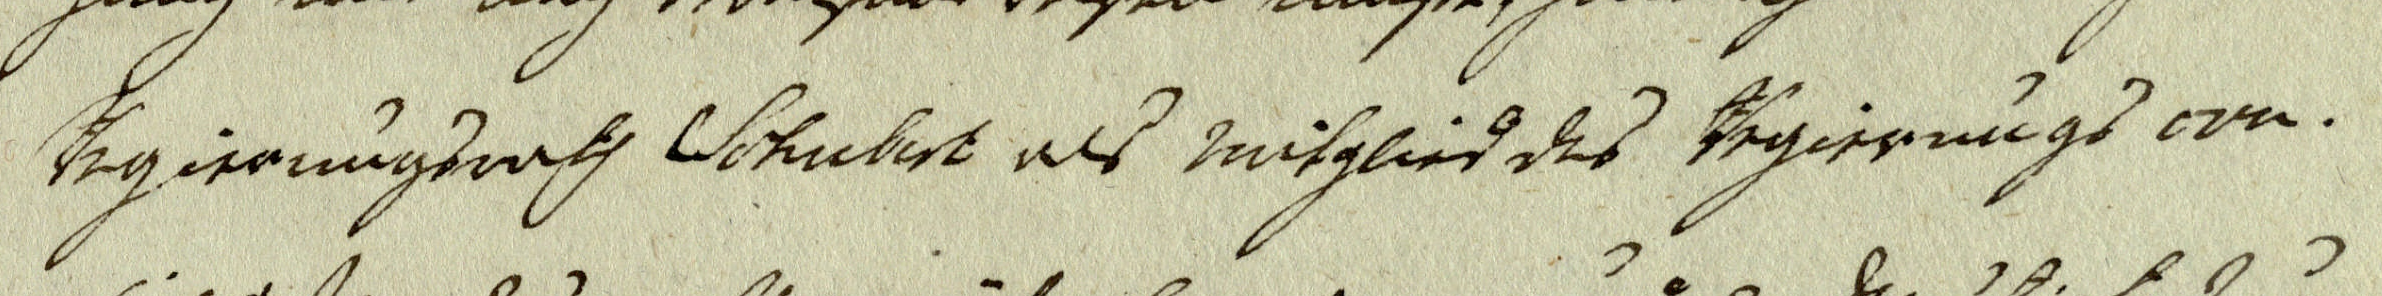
Regierungsrath Schubert als Mitglied des Regierungs con¬
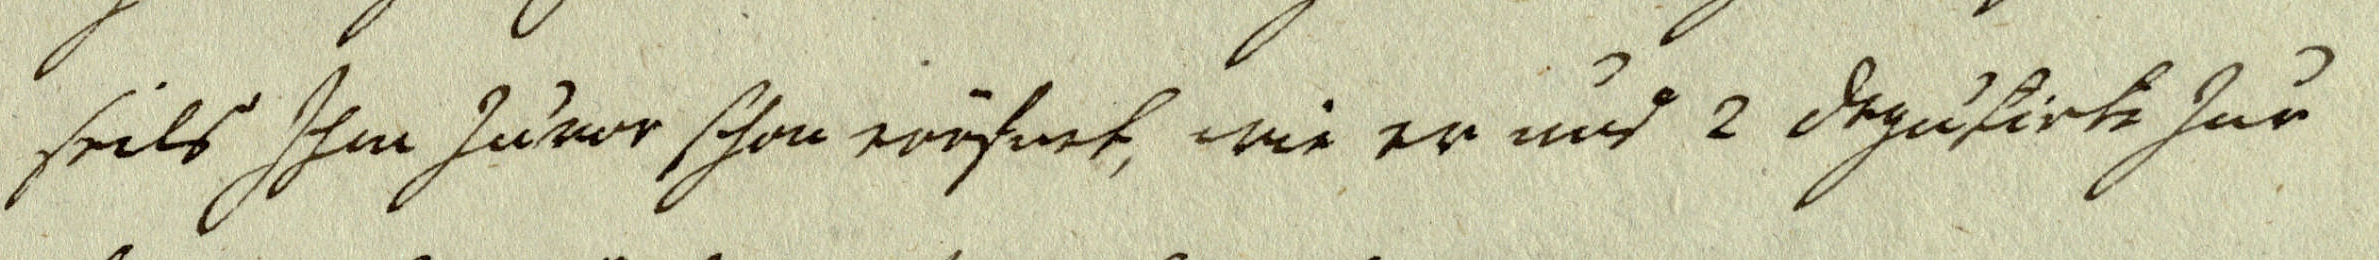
seits Ihm zuvor schon eröfnet, wie er und 2 Deputirte zur
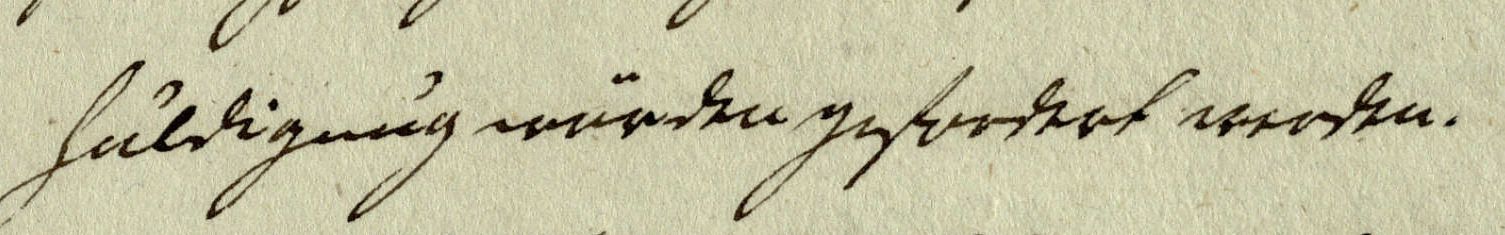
Huldigung würden gefordert werden.
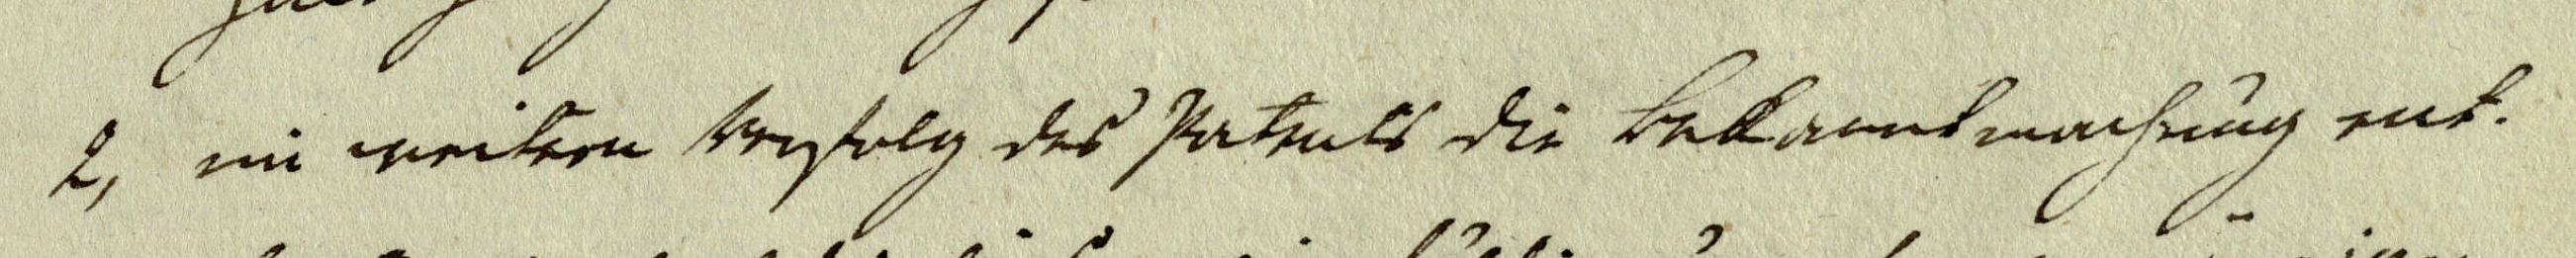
2, im weitern Verfolg des Patents die Bekanntmachung ent¬
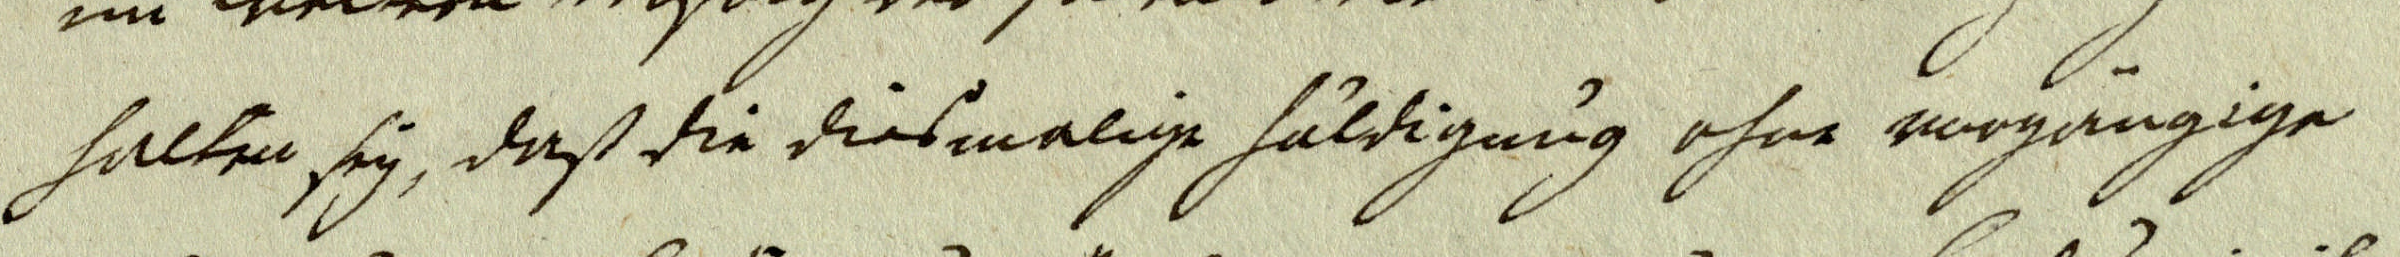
halten seÿ, daß die diesmalige Huldigung ohne vorgängige
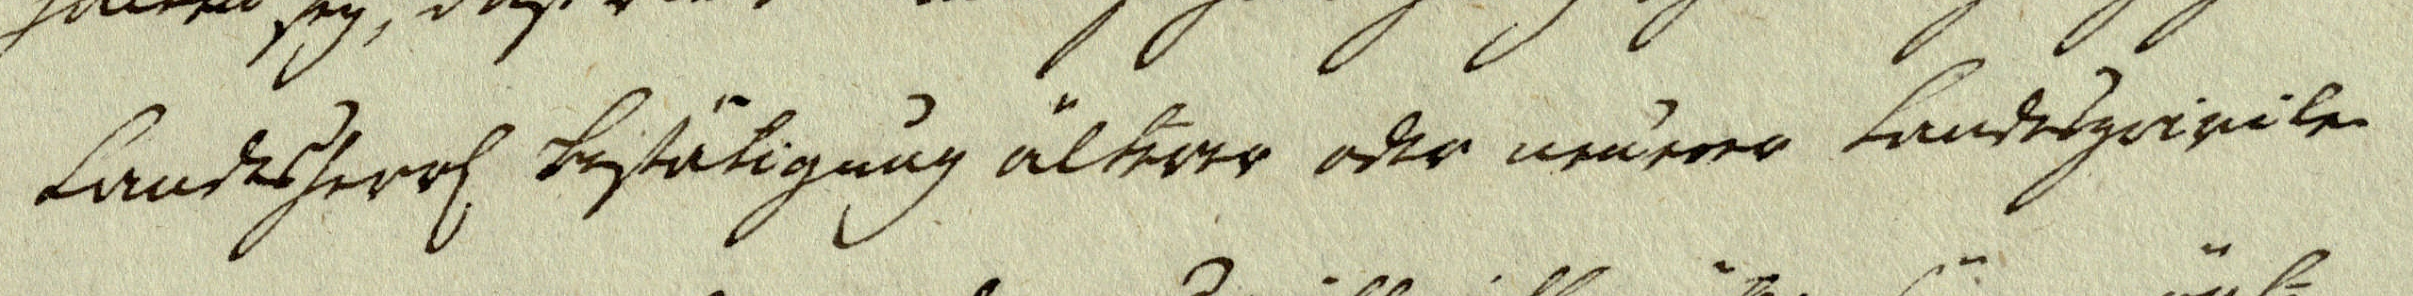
Landesherrl Bestätigung älterer oder neuerer Landesprivile¬
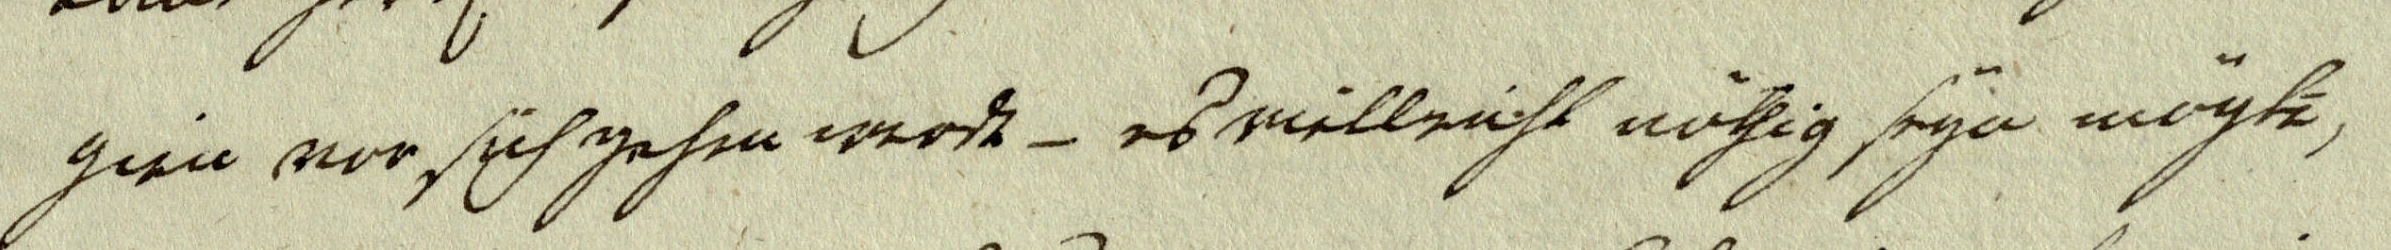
gien vor sich gehen werde es vielleicht nöthig seÿn mögte,
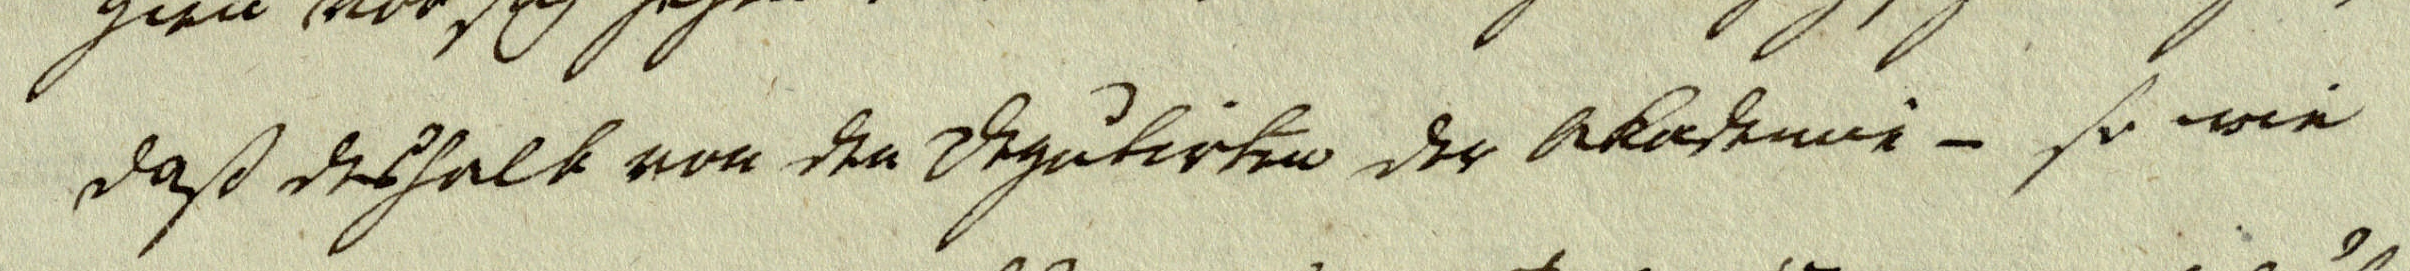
daß deshalb von den Deputirten der Akademie so wie
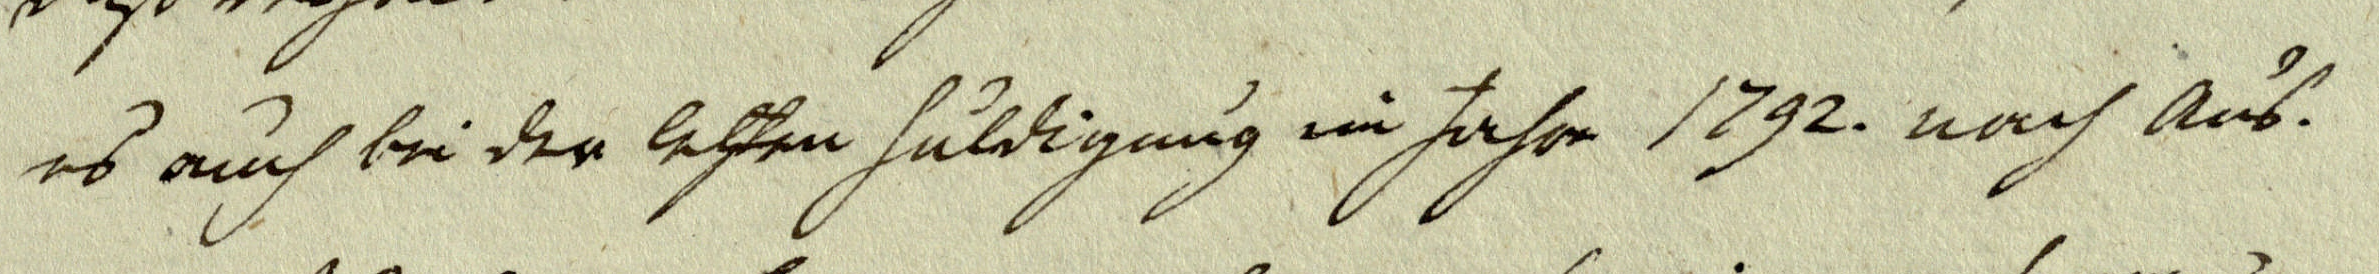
es auch bei der letzten Huldigung im Jahre 1792. nach Aus¬
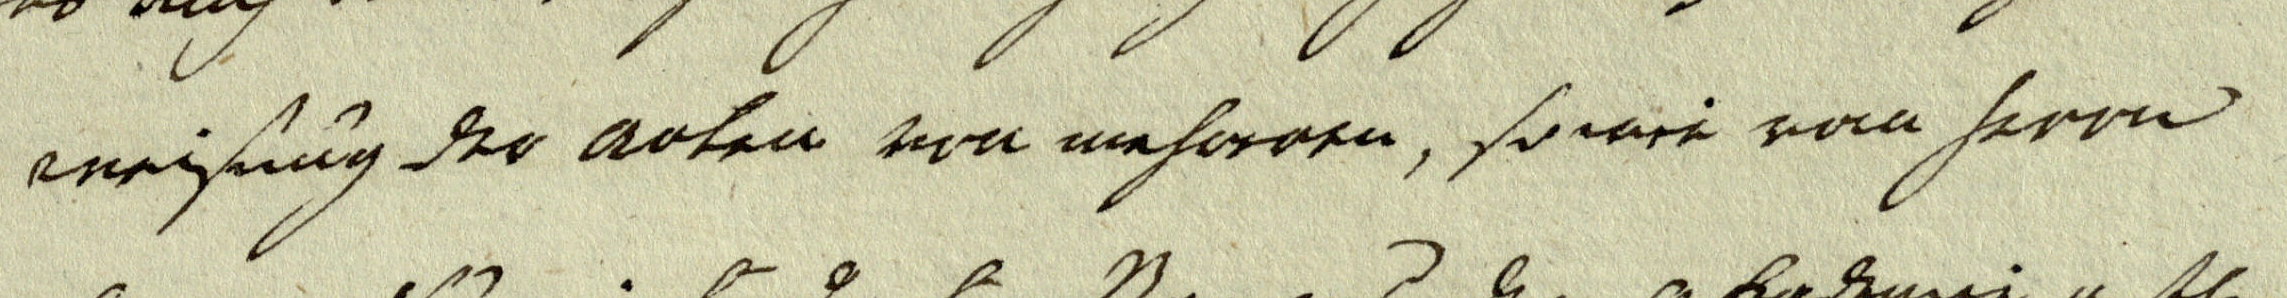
weisung der Acten von mehreren, so wie vom Herrn
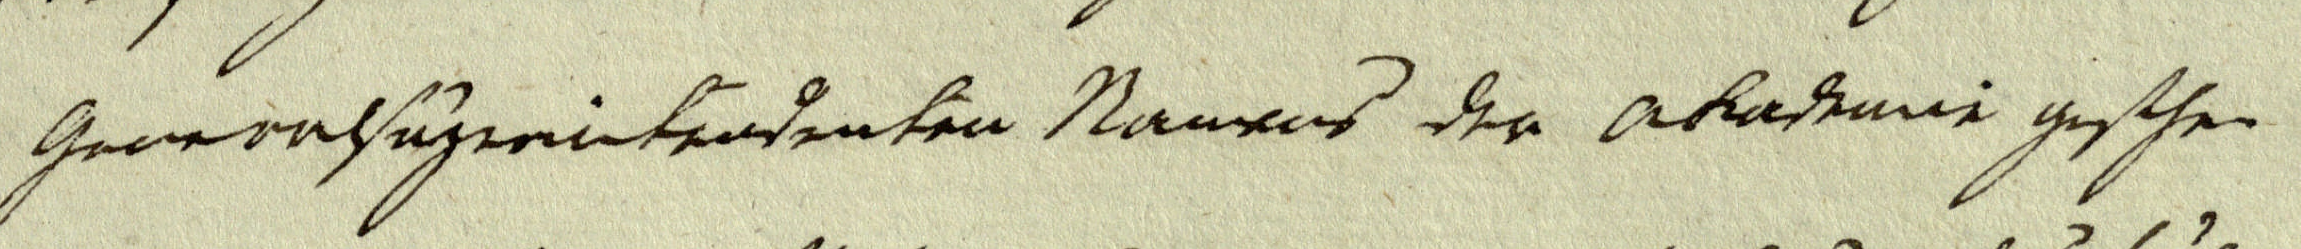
Generalsuperintendenten Namens der Akademie gesche¬
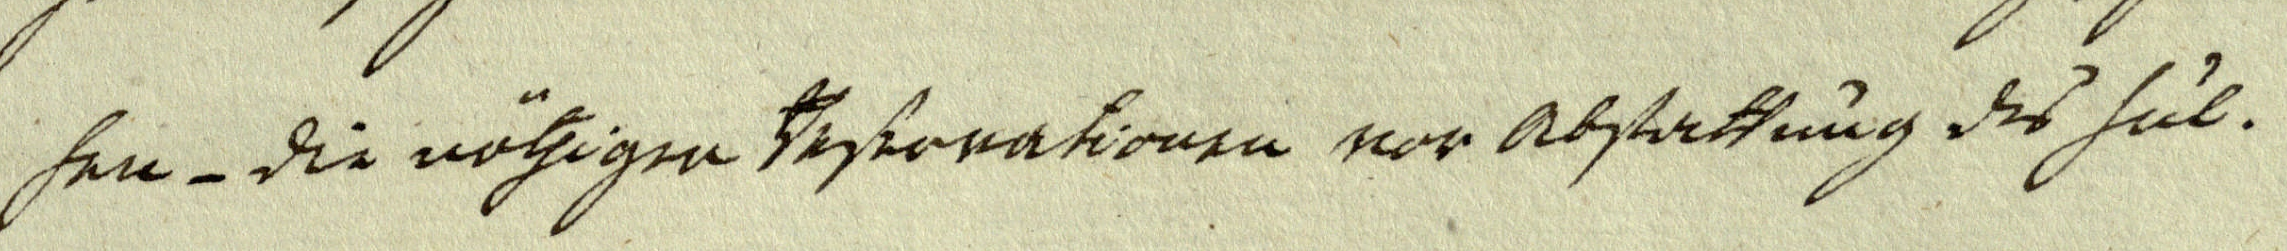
hen. die nöthigen Reservationen vor Abstattung des Hul¬
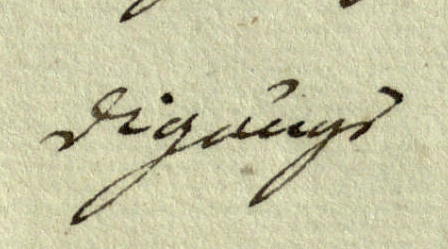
digungs
